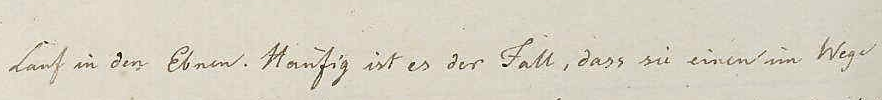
Lauf in den Ebnen. Häufig ist es der Fall, dass sie einen im Wege
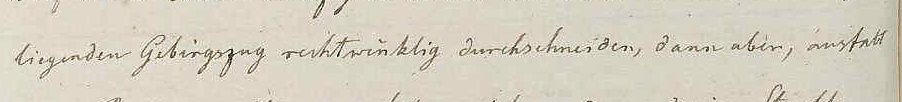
liegenden Gebirgszug rechtwinklig durchschneiden, dann aber, anstatt
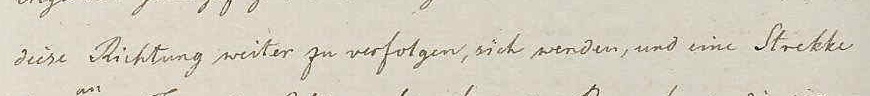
diese Richtung weiter zu verfolgen, sich wenden, und eine Strekke
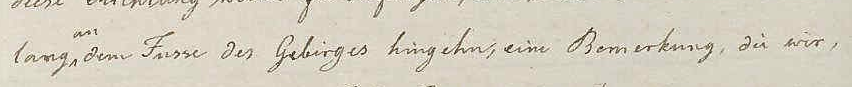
lang an dem Fusse des Gebirges hingehn, eine Bemerkung, die wir,
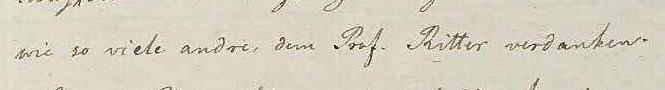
wie so viele andre, dem Prof. Ritter verdanken.
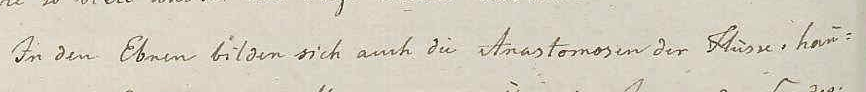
In den Ebnen bilden sich auch die Anastomosen der Flüsse: häu-
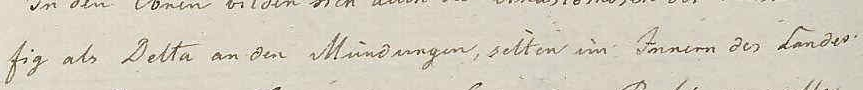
fig als Delta an den Mündungen, selten im Innern des Landes.
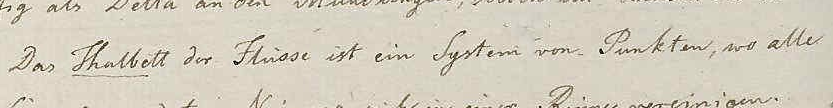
Das Thalbett der Flüsse ist ein System von Punkten, wo alle
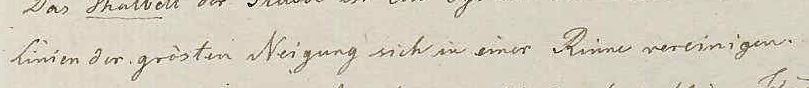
Linien der grösten Neigung sich in einer Rinne vereinigen.
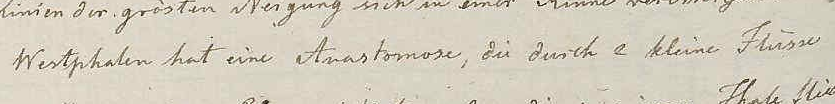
Westphalen hat eine Anastomose, die durch 2 kleine Flüsse
